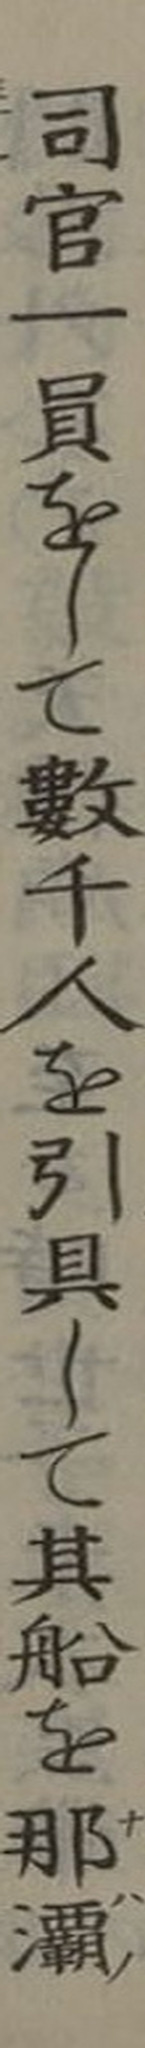司官一員をして數千人を引具して其船を那㶚
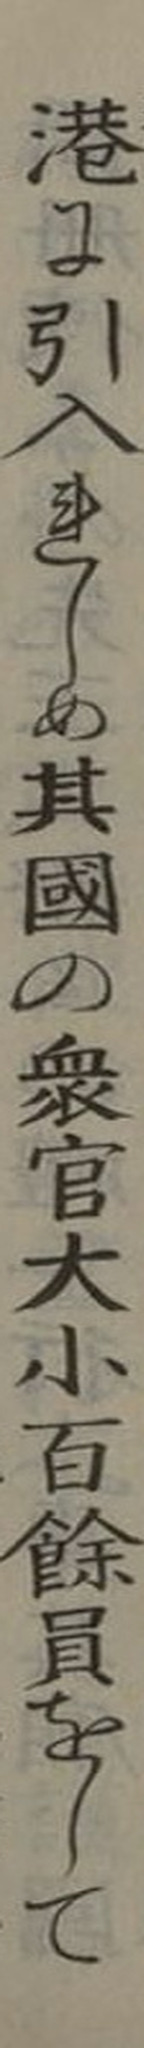港に引入れしめ其國の衆官大小百餘員をして

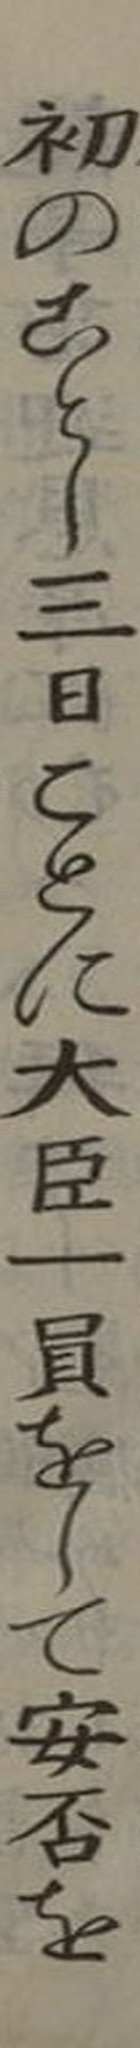初のことし三日ことに大臣一員をして安否を
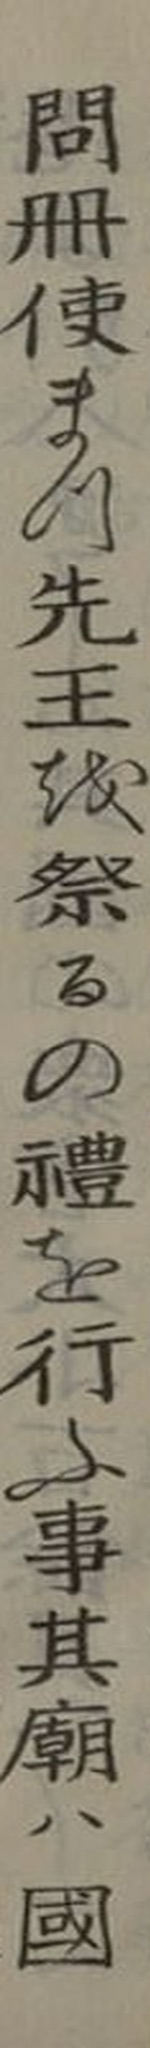問册使まつ先王を祭るの禮を行ふ事其廟は國
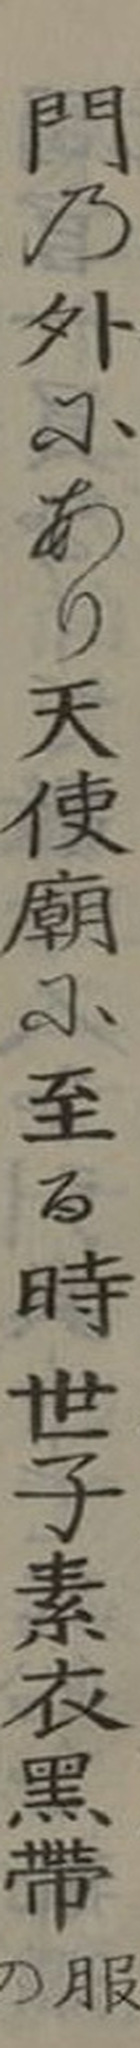門の外にあり天使廟に至る時世子素衣黑帶服の
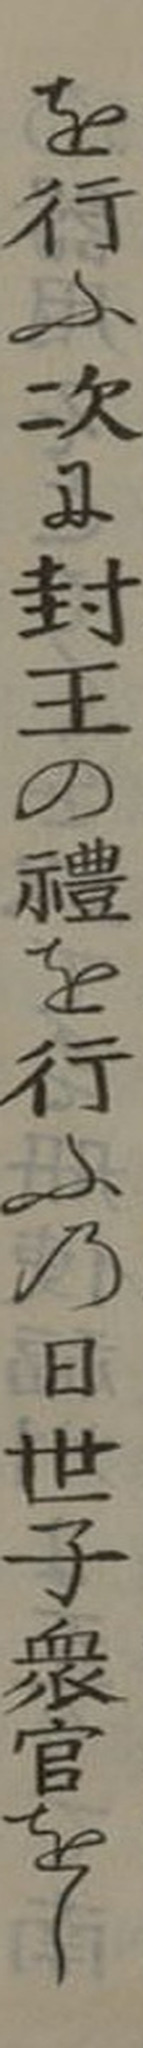を行ふ次に封王の禮を行ふの日世子衆官をし
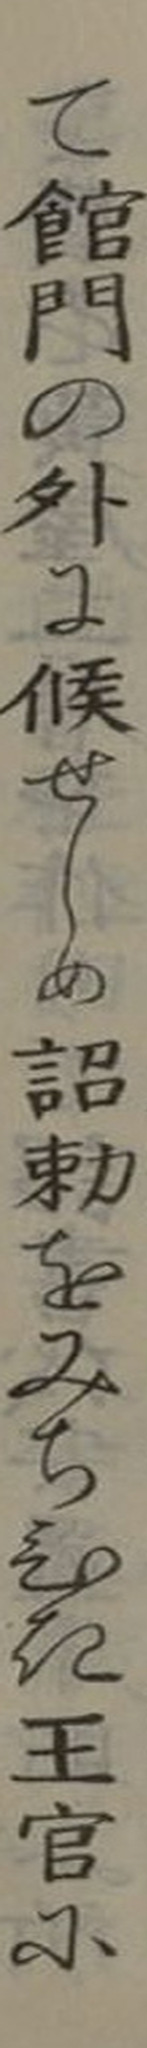て館門の外に候せしめ詔勅をみちひき王官に
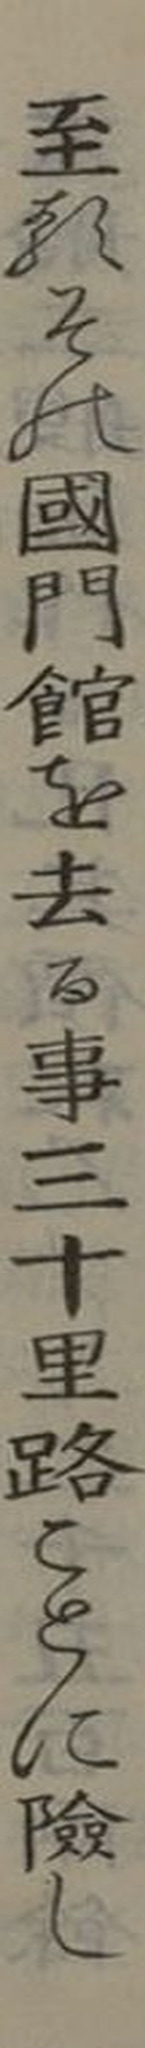至るその國門館を去る事三十里路ことに險し
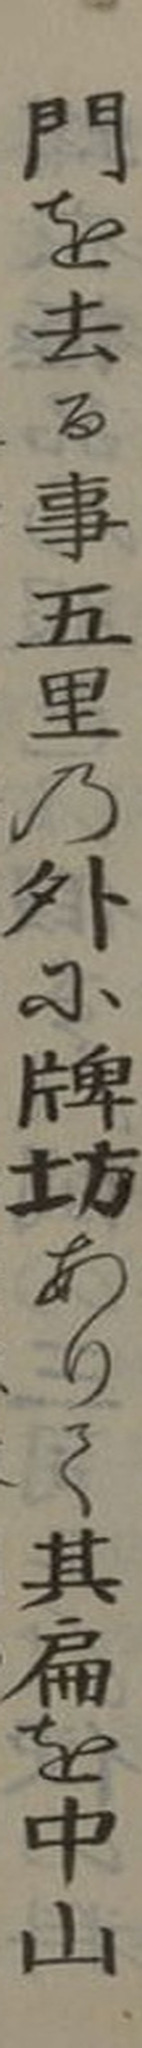門を去る事五里の外に牌坊ありて其扁を中山
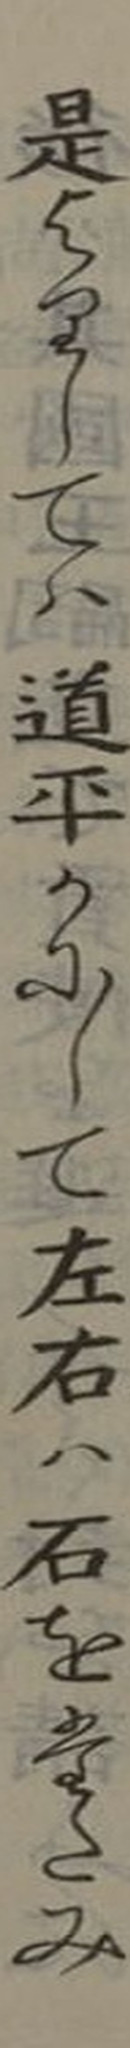是よりしては道平かにして左右は石をたたみ
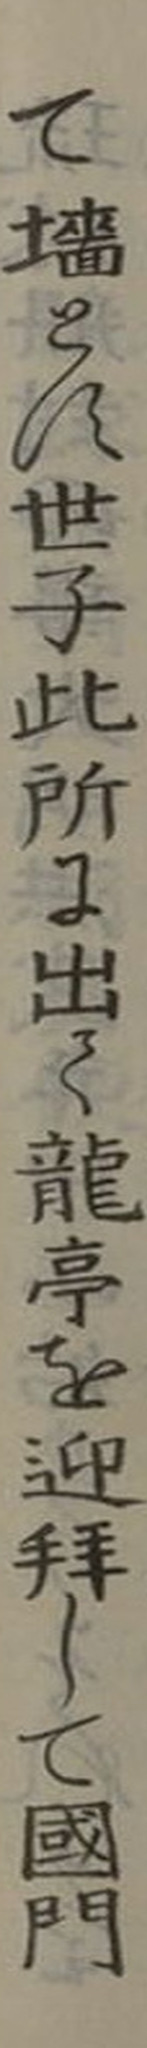て墙とす世子此所に出て龍亭を迎拜して國門
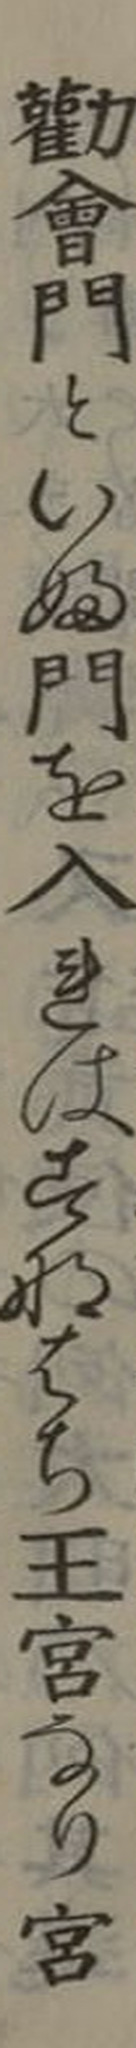勸㑹門といふ門を入れはすなはち王宮なり宮
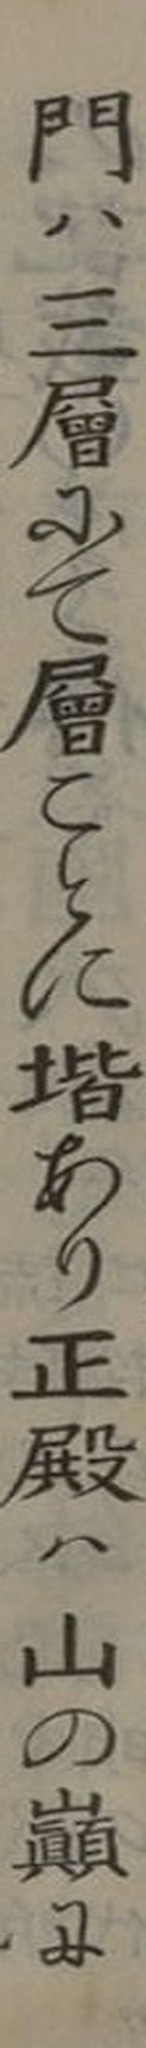門は三層にて層ことに堦あり正殿は山の巓に
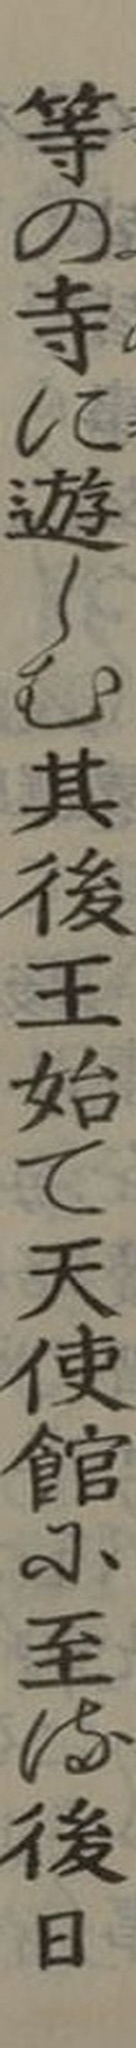等の寺に遊しむ其後王始て天使館に至る後日
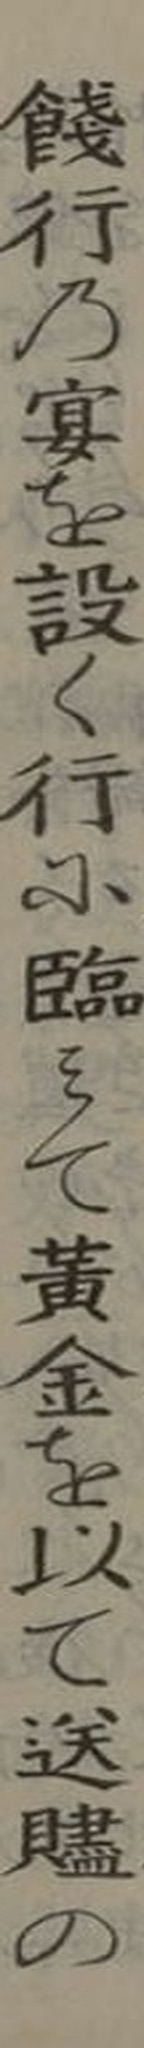錢行の宴を設く行に臨みて黃金を以て送贐の
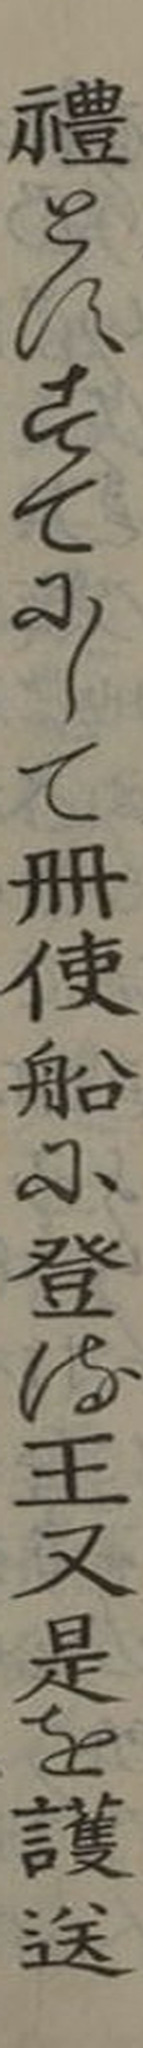禮とすすてにして册使船に登る王又是を護送
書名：骨董録
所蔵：University of the Ryukyus Library
